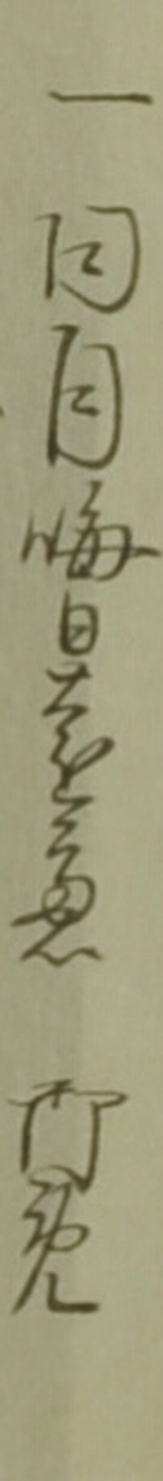一同月晦日遠慮御免
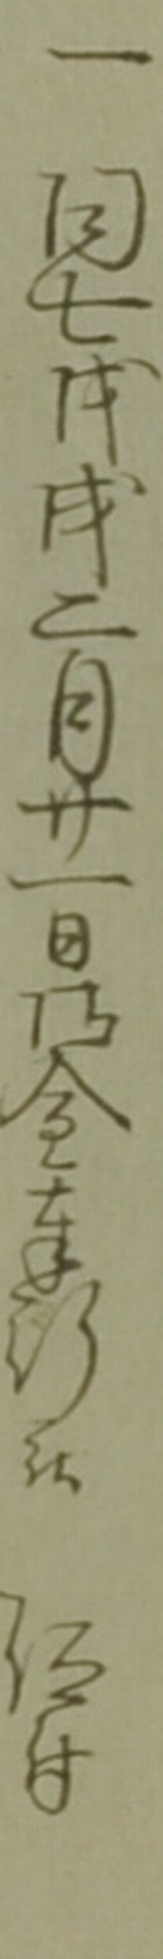一同七戊戌二月廿一日御金奉行被仰付
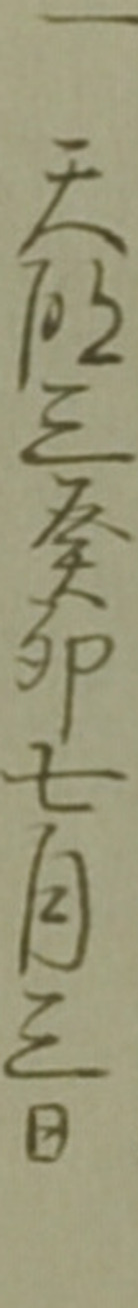一天明三癸卯七月三日
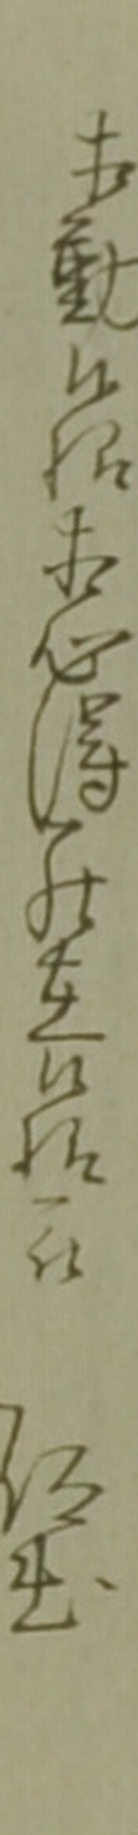相勤候様相心得罷在候様被仰出
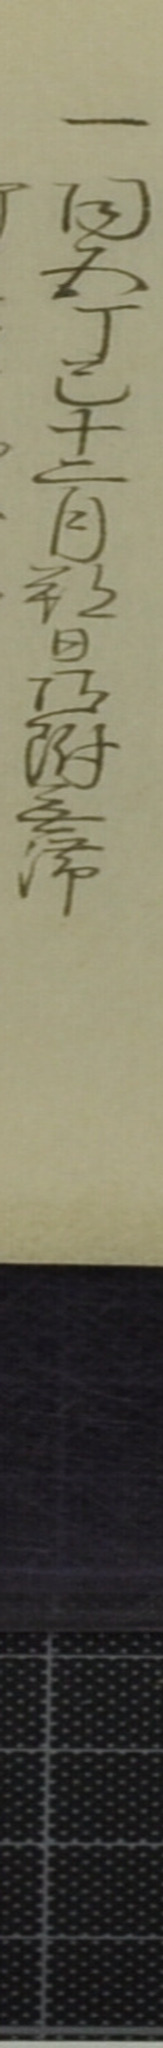一同五丁巳十二月朔日御附無滞
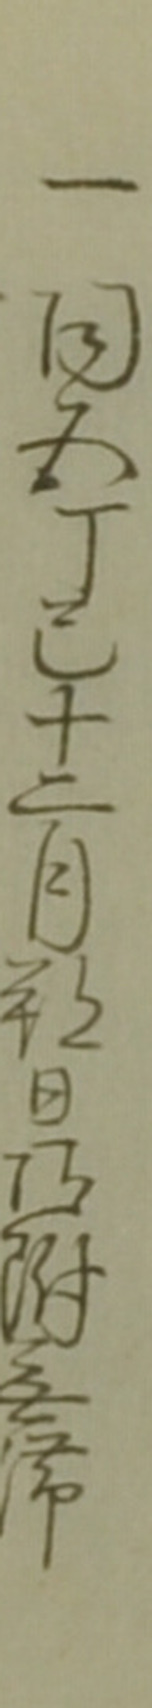一同五丁巳十二月朔日御附無滞
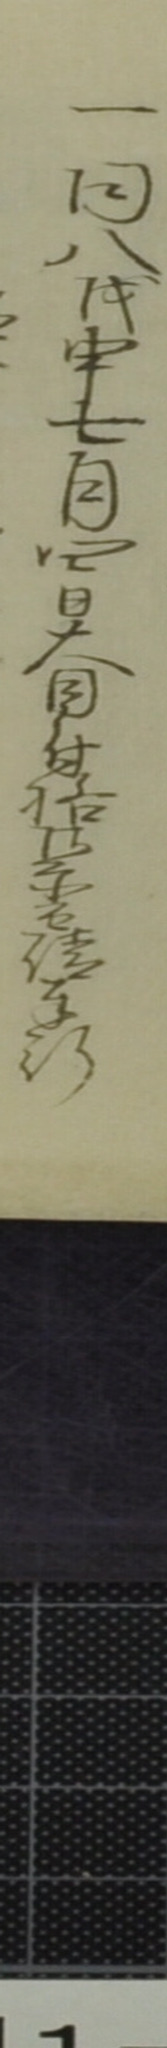一同八戊申七月四日大目付格御普請奉行
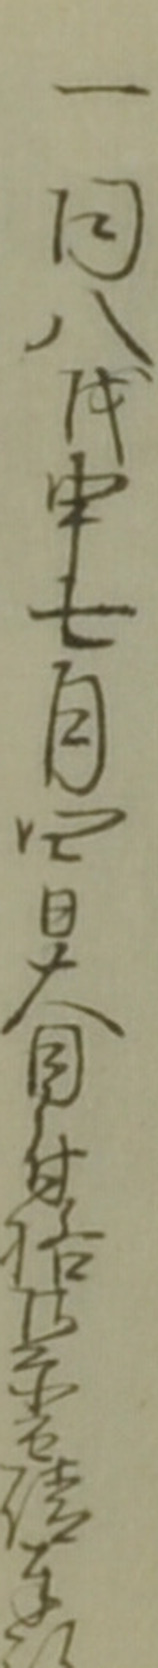一同八戊申七月四日大目付格御普請奉行
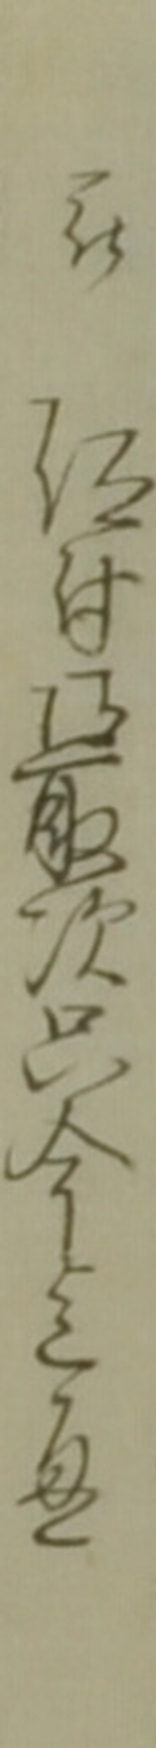被仰付御取次只今迄通
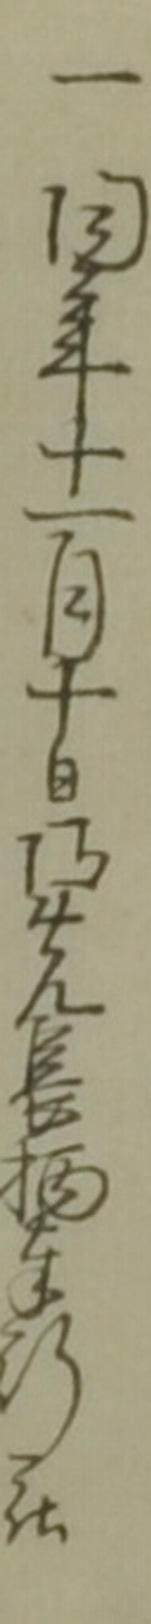一同年十一月十日御先長柄奉行被
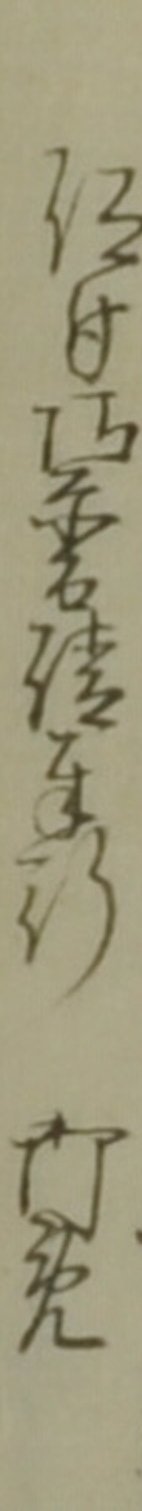仰付御普請奉行御免
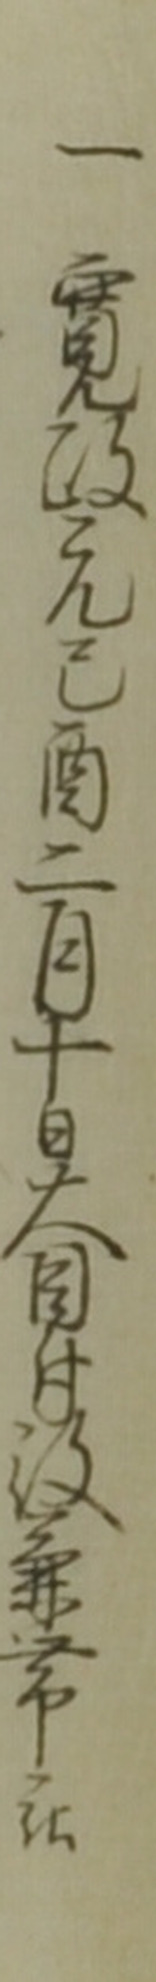一寛政元己酉二月十日大目付役兼帯被
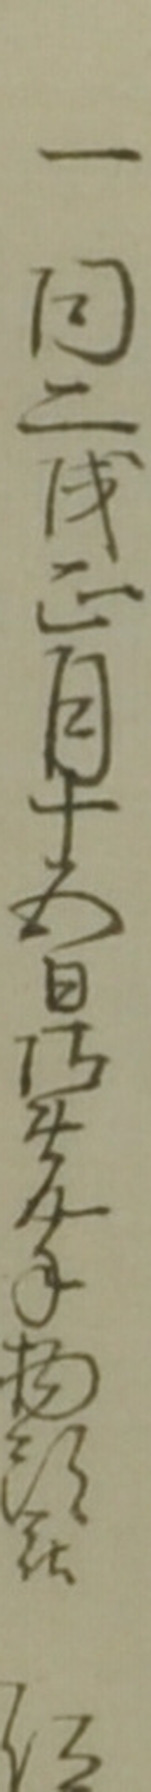一同二戊正月十五日御先手物頭首尾能
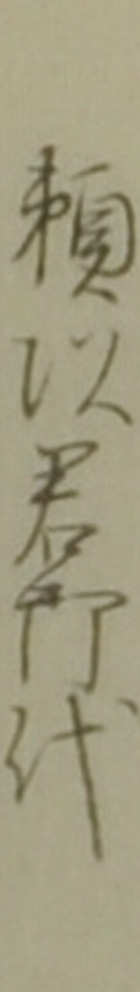頼以君御代
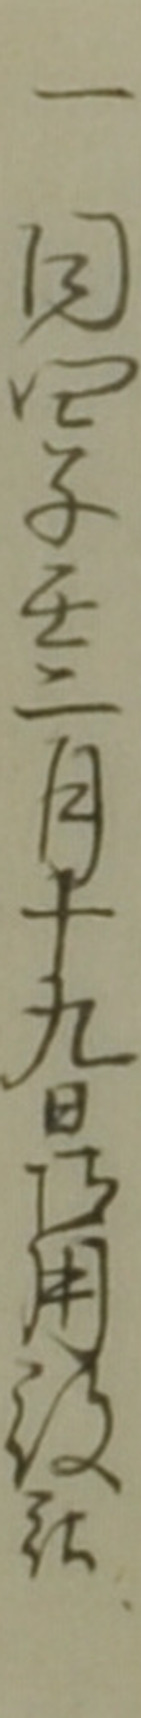一同四子壬二月十九日御用役被
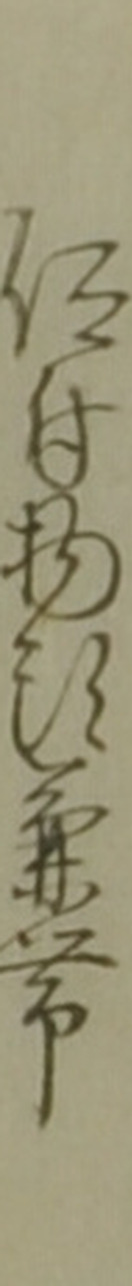仰付物頭兼帯
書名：給人諸士勤仕録（三）
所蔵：伊那市立高遠町図書館・合同会社AMANE
